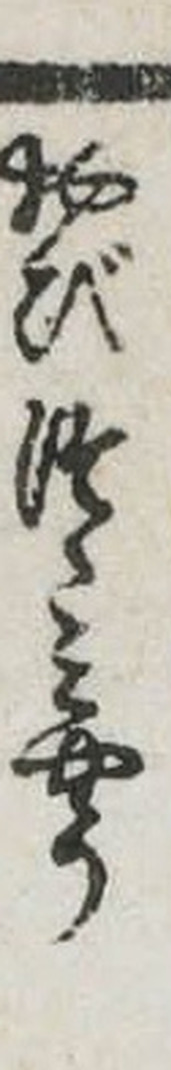おびつゝみやう
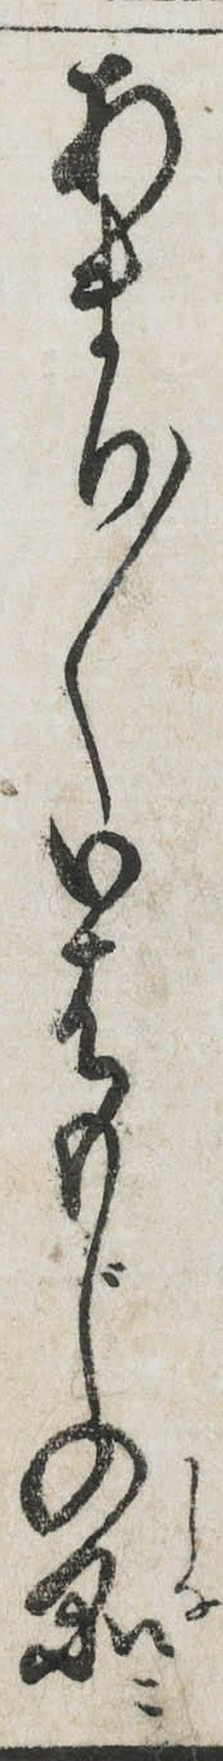あまり〳〵御はもじの品に
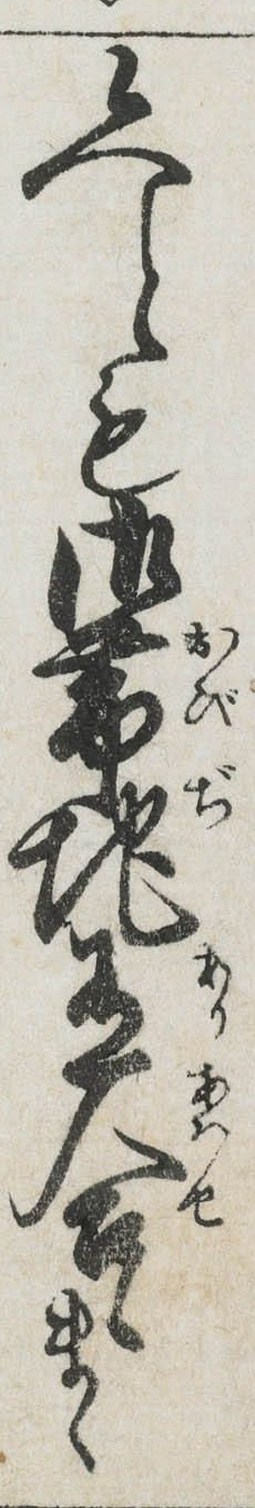候へとも御帯地有合候まゝ
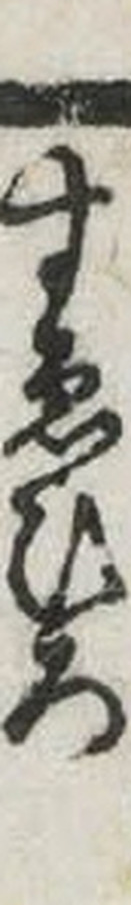すゑひろ
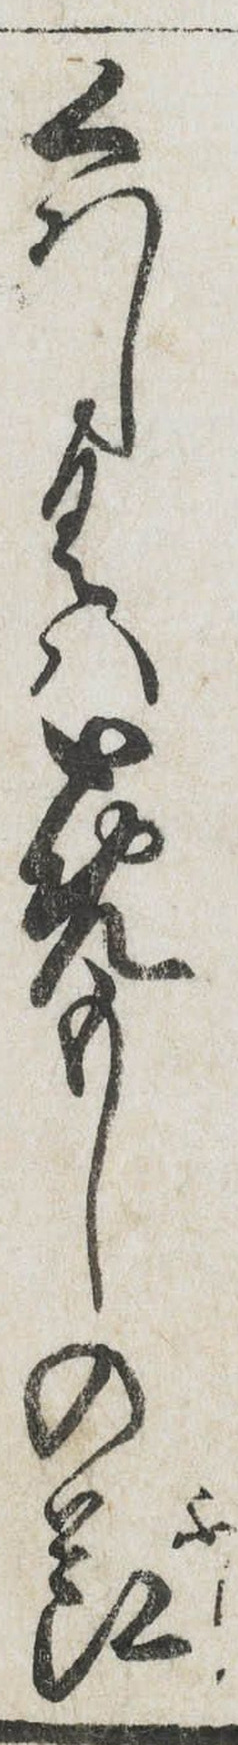くはしくは御めもしの節
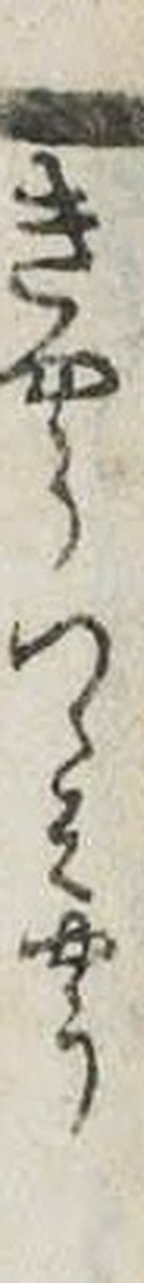きやうつゝみやう
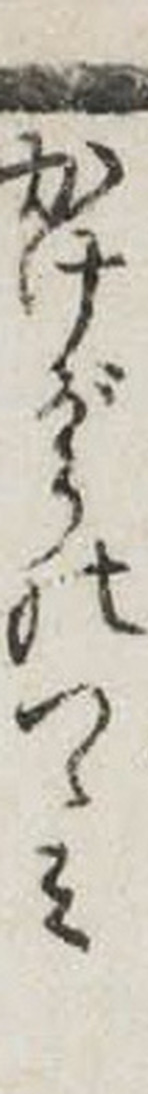かけがうのつゝみ
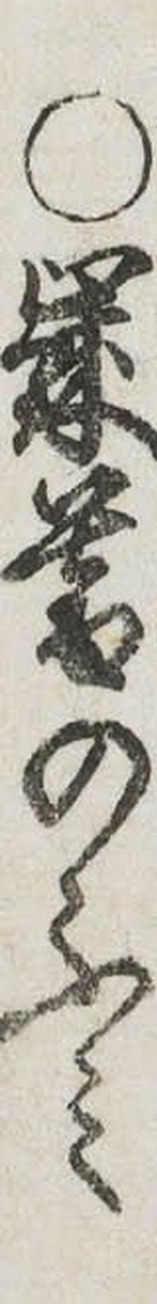○歳暮のふみ
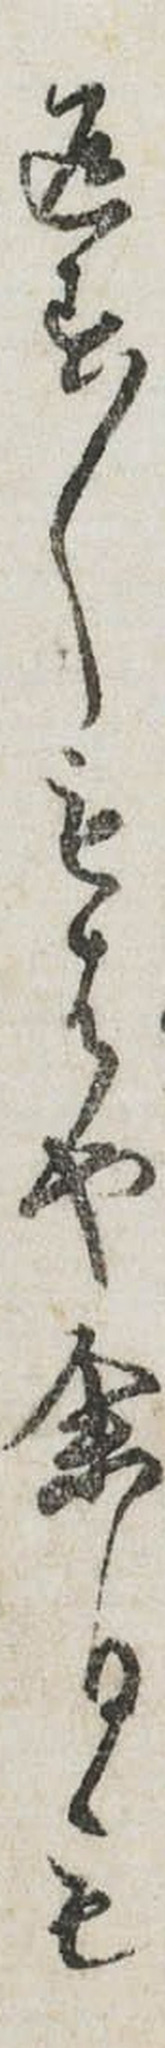返す〳〵もはや余日も
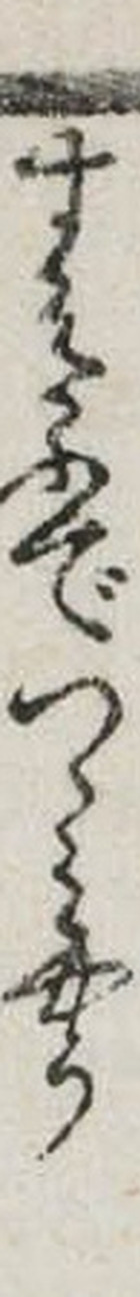すみふでつゝみやう
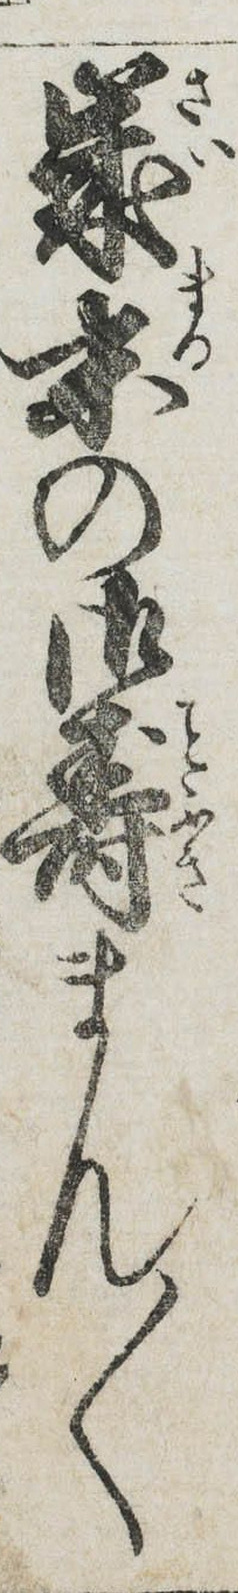歳末の御寿まん〳〵
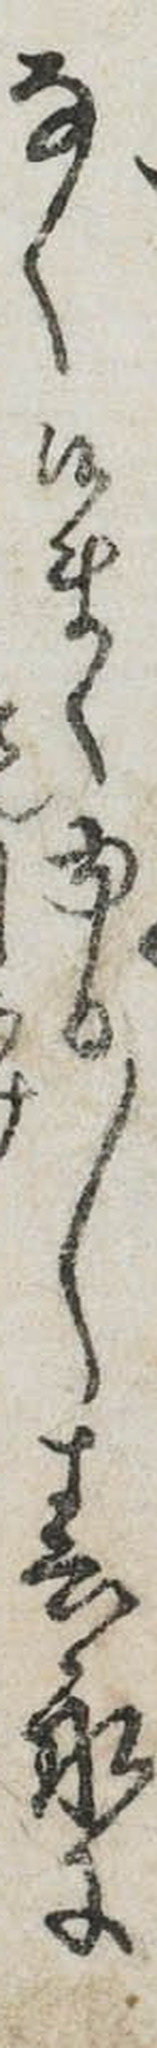なく候まゝゆる〳〵春永に
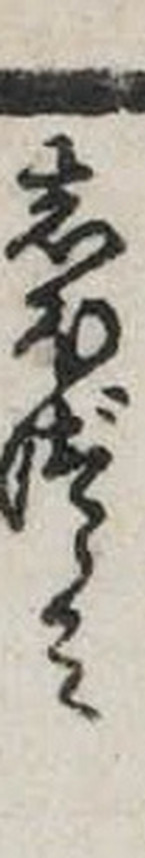しほづゝみ
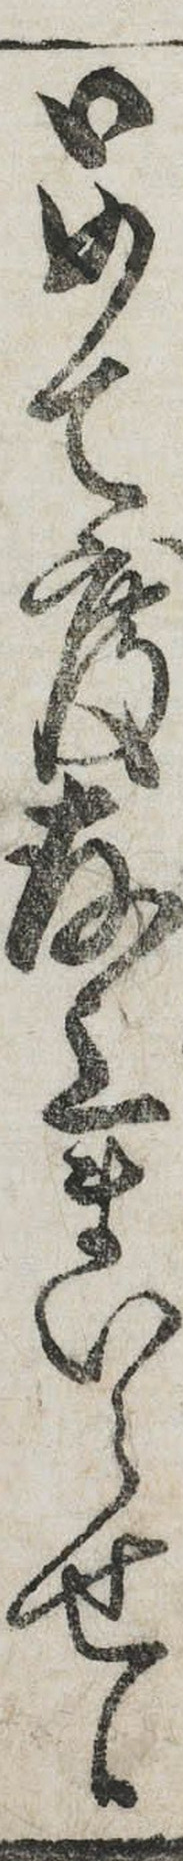御めて度存上まいらせ候
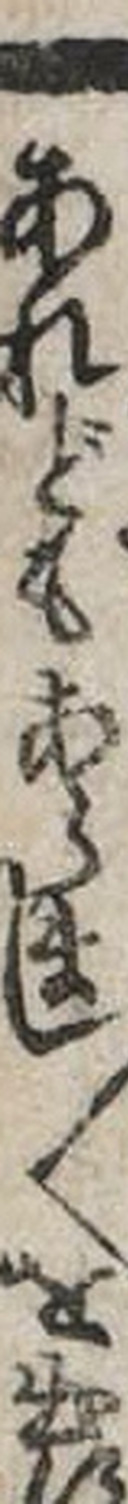あれどもあらましを出す

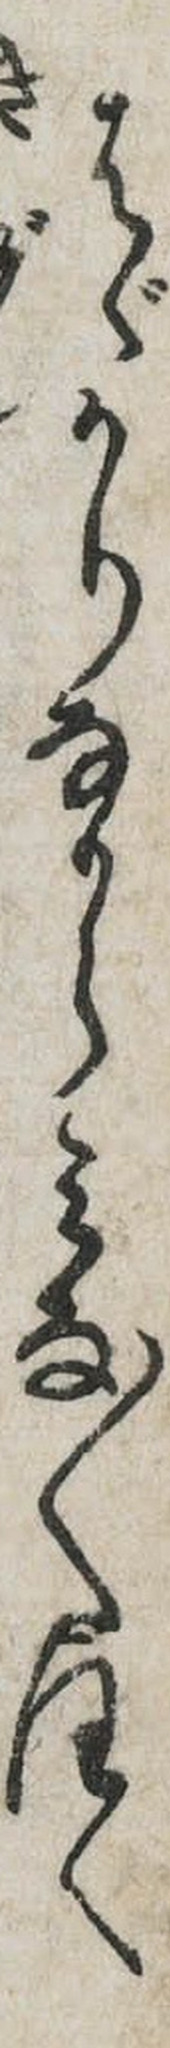はゞかりなからみな〳〵さまへ
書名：頭書萬用婦人手紙之文言
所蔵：東京学芸大学教育コンテンツアーカイブ
